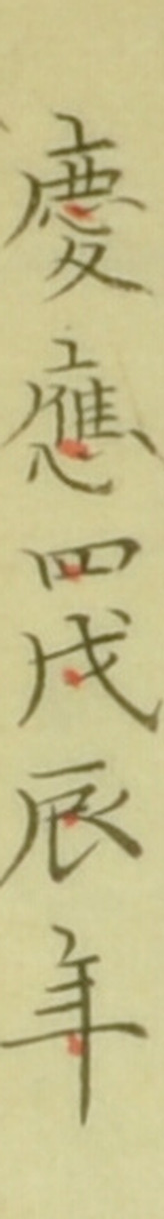慶応四戊辰年
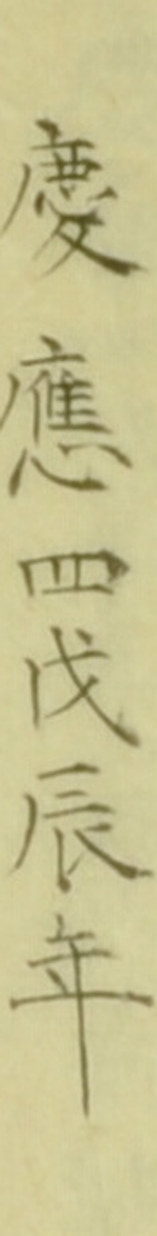慶応四戊辰年
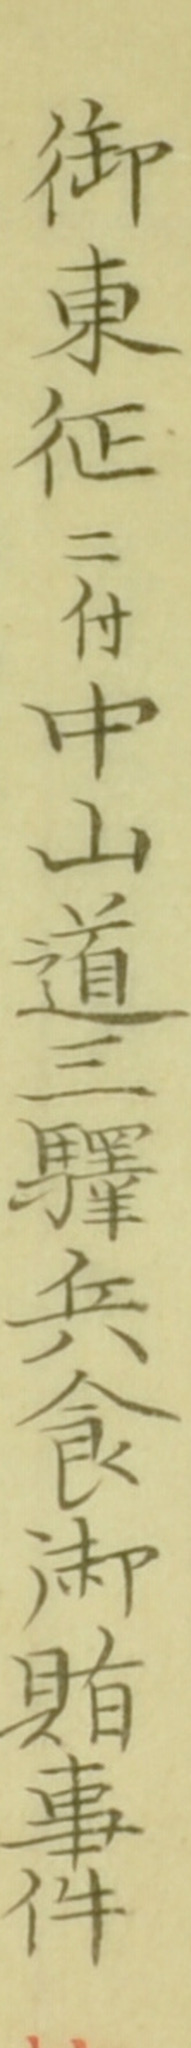御東征ニ付中山道三駅兵食御賄事件控
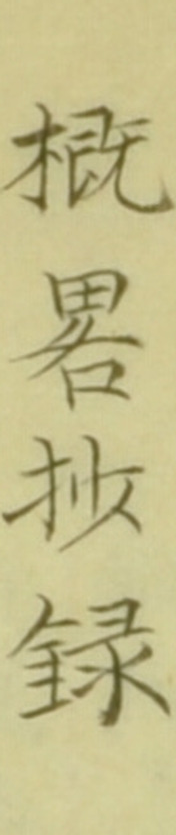概略抄録
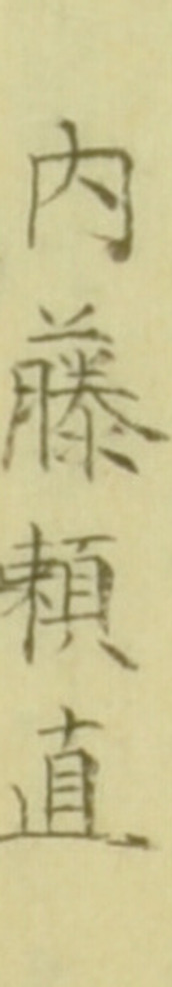内藤頼直

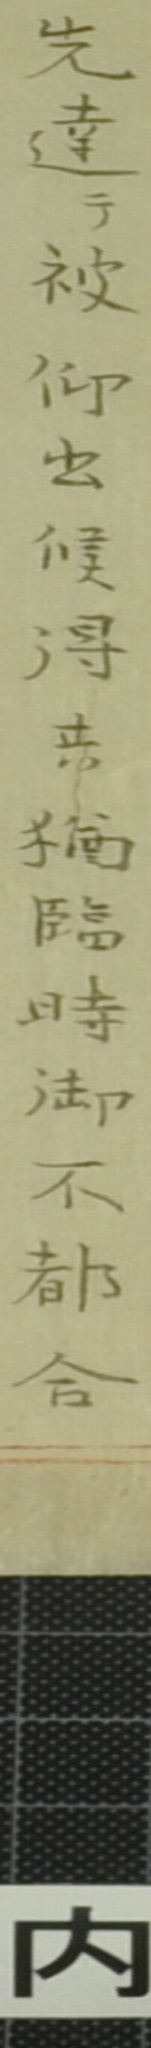先達テ被仰出候得共猶臨時御不都合

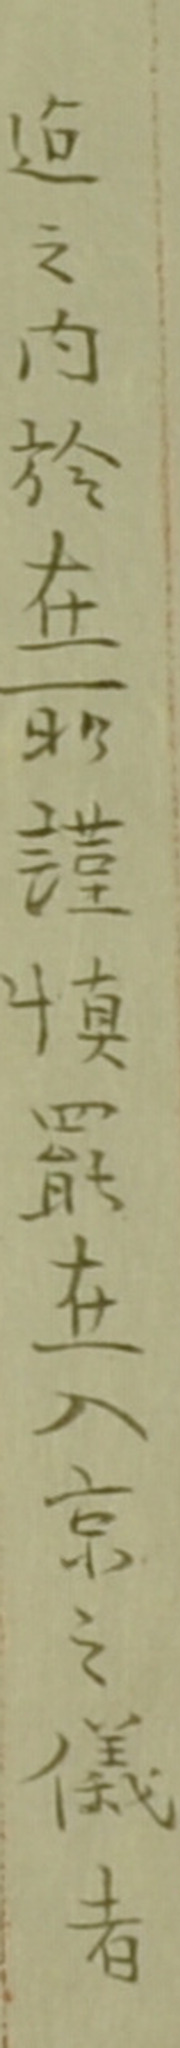迄之内於在所謹慎罷在入京之儀者
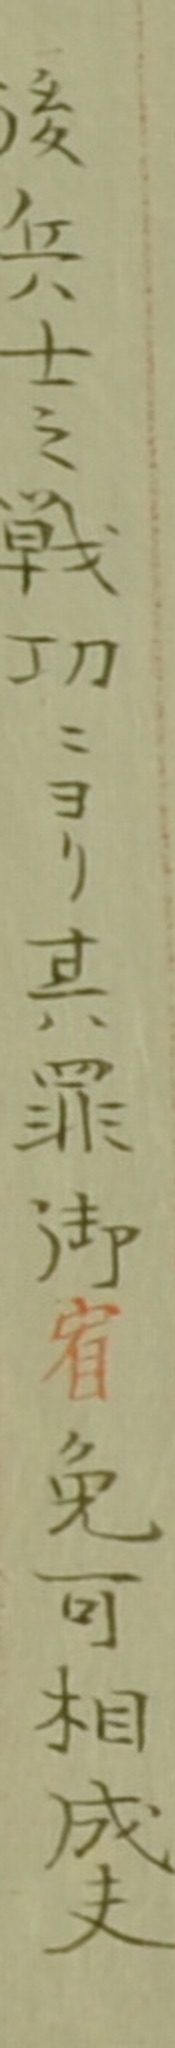後兵士之戦功ニヨリ其罪御宥免可相成夫
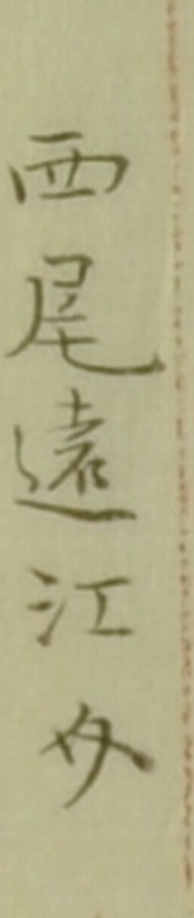西尾遠江介
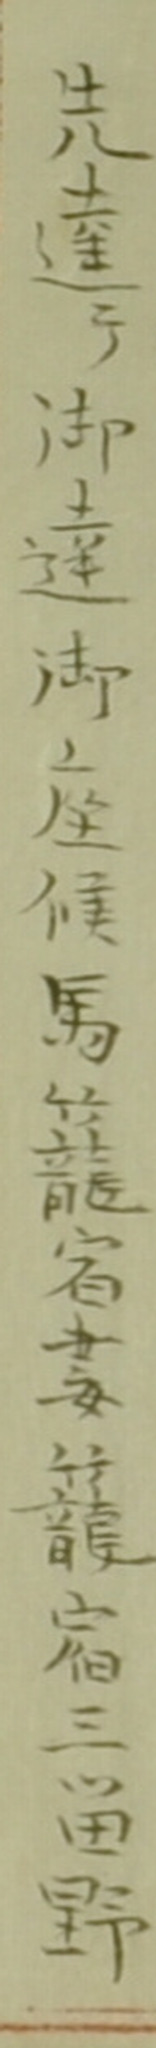先達テ御達御座候馬籠宿妻籠宿三留野
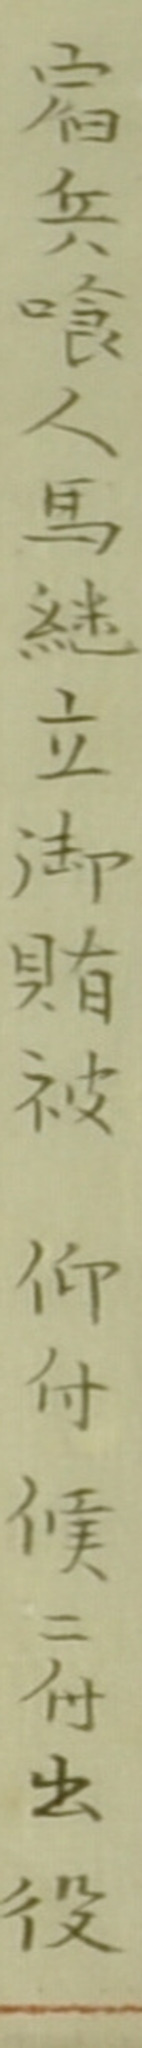宿兵喰人馬継立御賄被仰付候ニ付出役

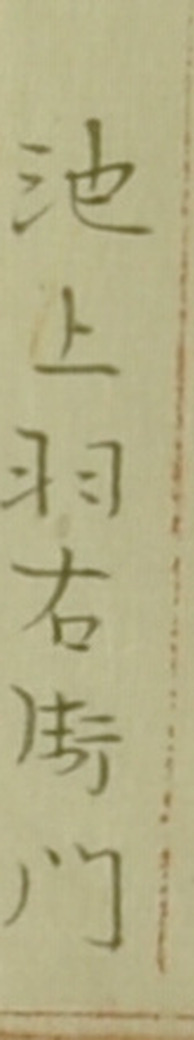池上羽右衛門

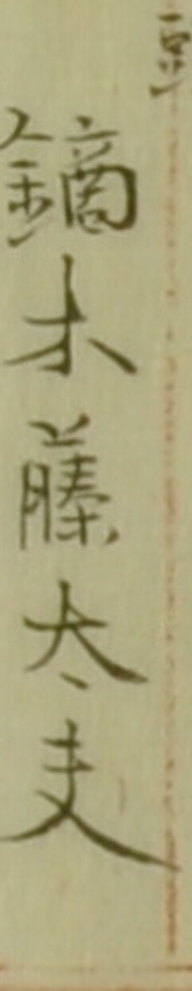鏑木藤太郎
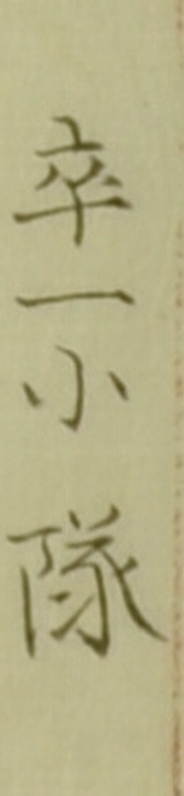卒一小隊
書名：御東征ニ付中山道三駅兵食御賄事件（控）
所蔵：伊那市立高遠町図書館・合同会社AMANE
